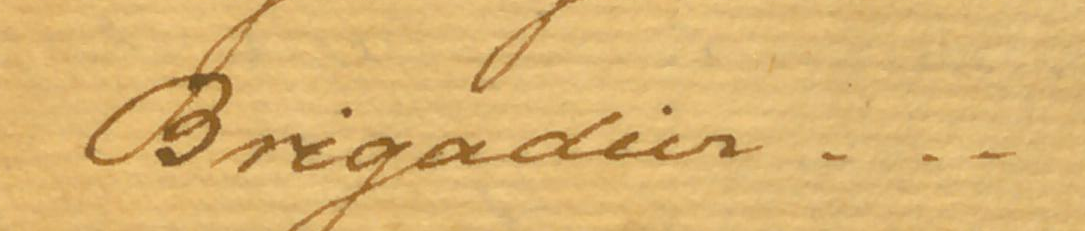Brigadier...
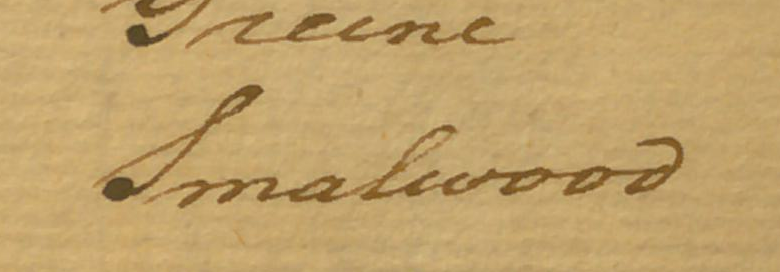Smalwood
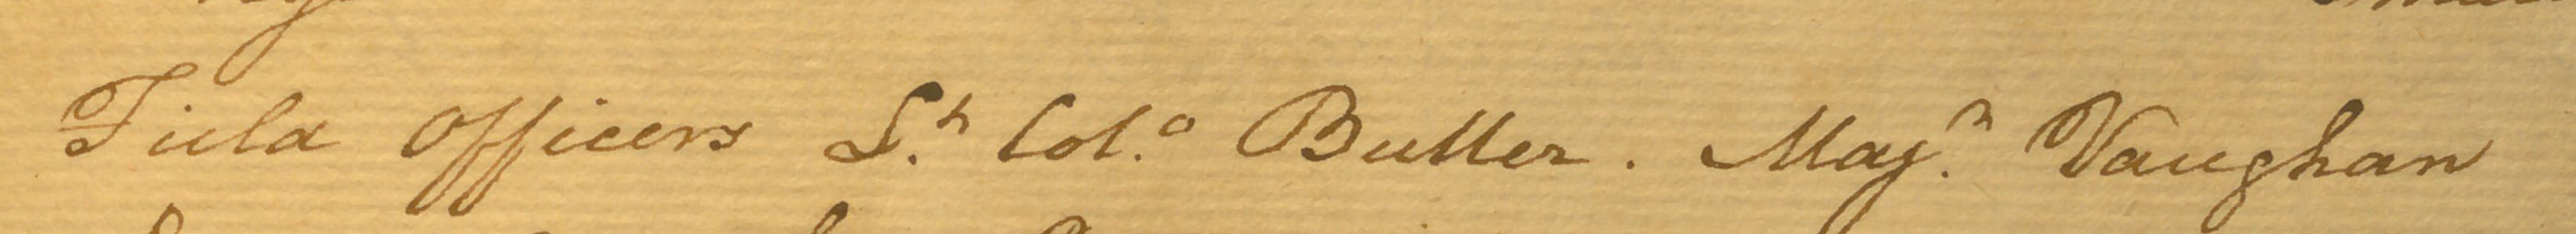Field Officers L^t. Col^o. Buller. Maj^r. Vaughan
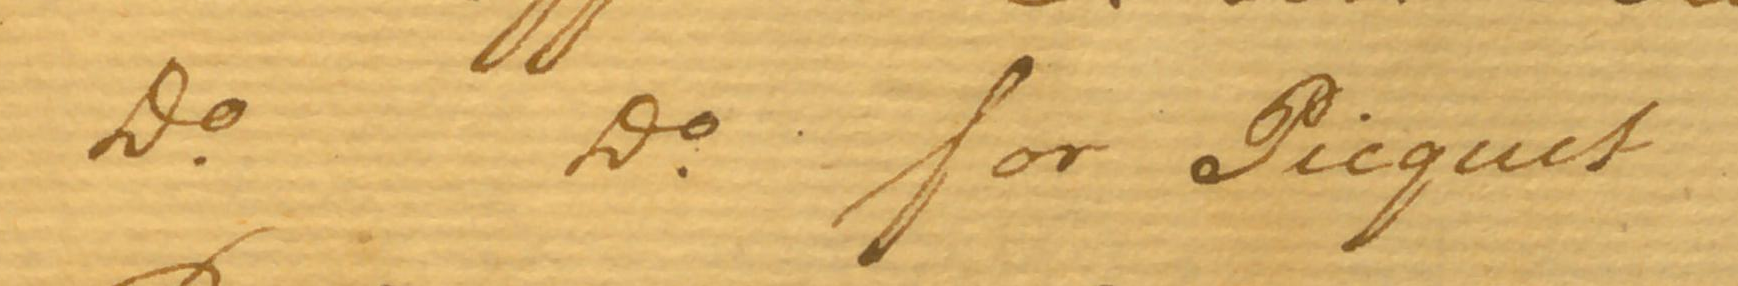D^o. D^o. for Picquet
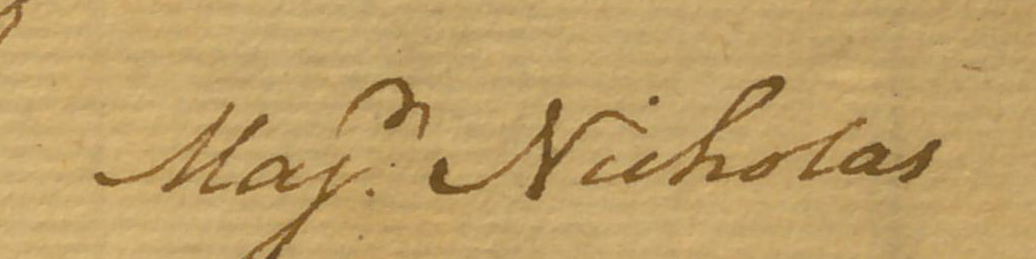Maj^r: Nicholas
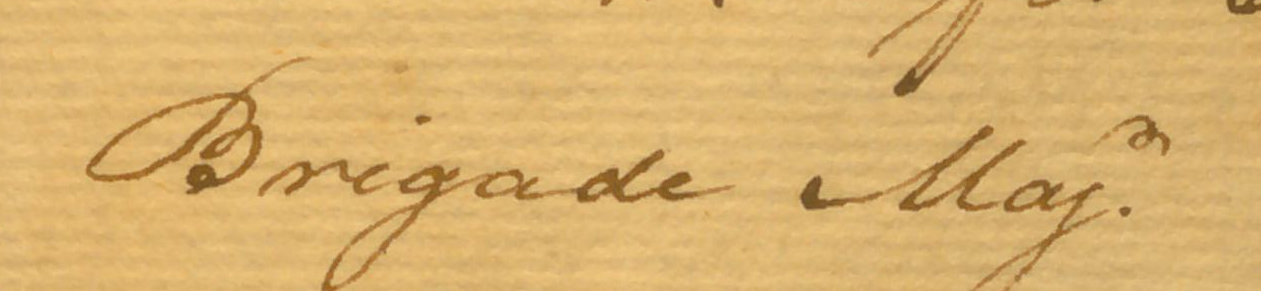Brigade Maj^r.
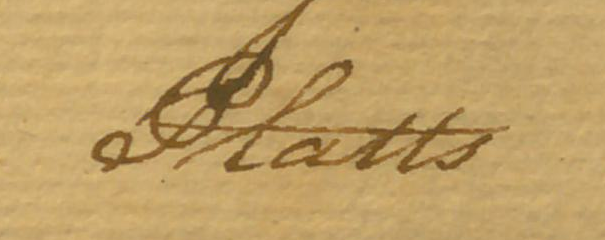Platts
